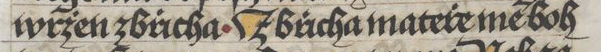wrżen zbṙicha.Z bṙicha mateṙe mé boh
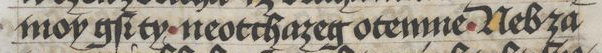moy gſi ty.neotchazeg otemne.Neb za¬
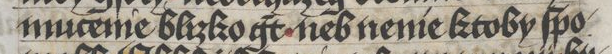mucenie blizko ḡt.neb nieníe ktoby ſpo¬
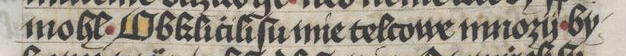mohl.Obkliċiliſu mie telcowe mnozij.by¬
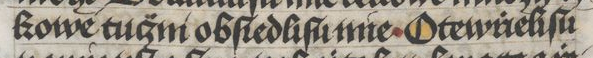kowe tucżní obſiedliſu mie.Otewṙieliſú
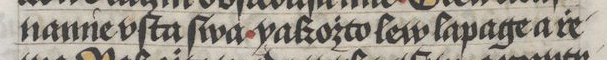na mie vſta ſwa.yakożto lew lapage a ṙe¬
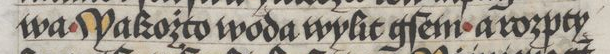wa.Yakożto woda wylit gſem.a rozpty¬
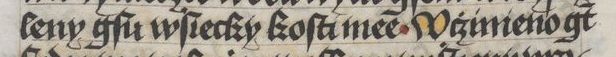leny gſu wẛiecky koſti mee.Ucżinieno ḡt
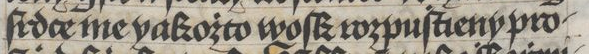srdce me yakożto woſk rozpuẛtieny pro¬
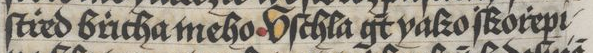ſtṙed bṙicha meho.Vſchla ḡt jako ẛkoṙepi¬
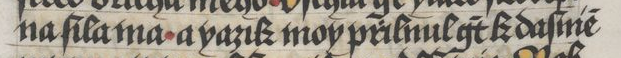na ſila ma.a yazik moy pṙilnul ḡt k daſniē
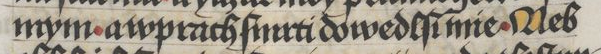mym.a wprach ſmrti dowedlſi mie.Neb
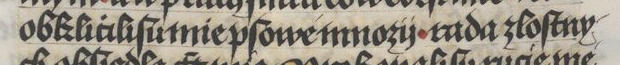obkliċiliſu mie pſowé mnozij.rada zloſtny¬
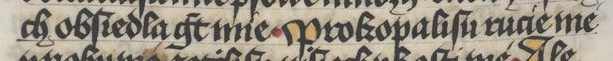ch obſiedla ḡt mie.Prokopaliſu rucie mé
